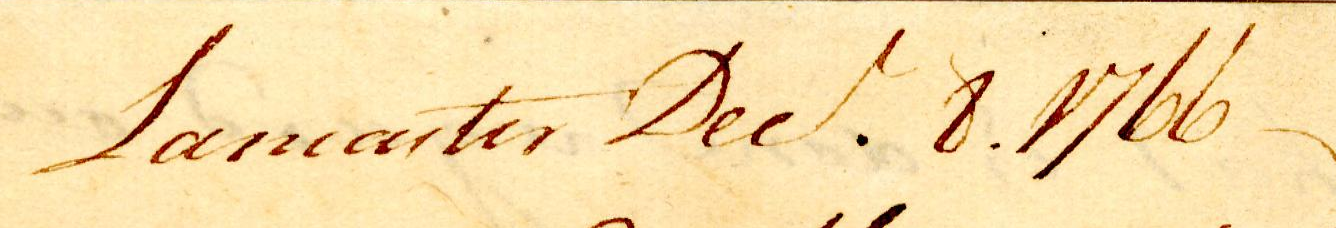Lancaster Dec^r. 8. 1766
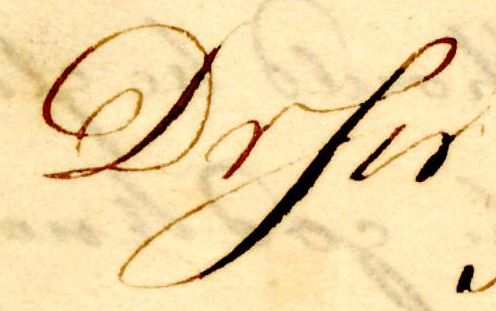Dr Sir
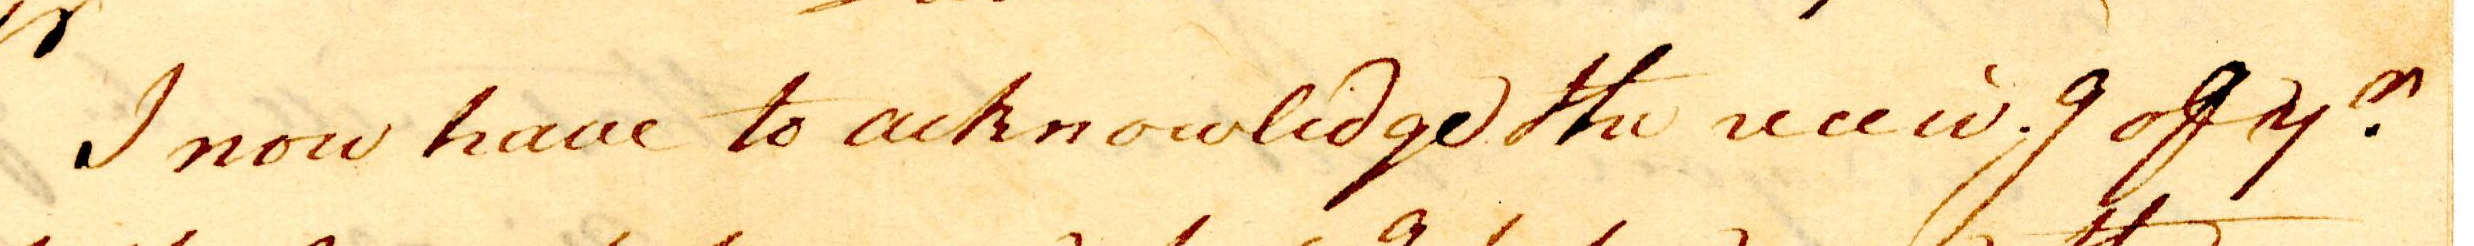I now have to acknowledge the receiv.^g of y^r.
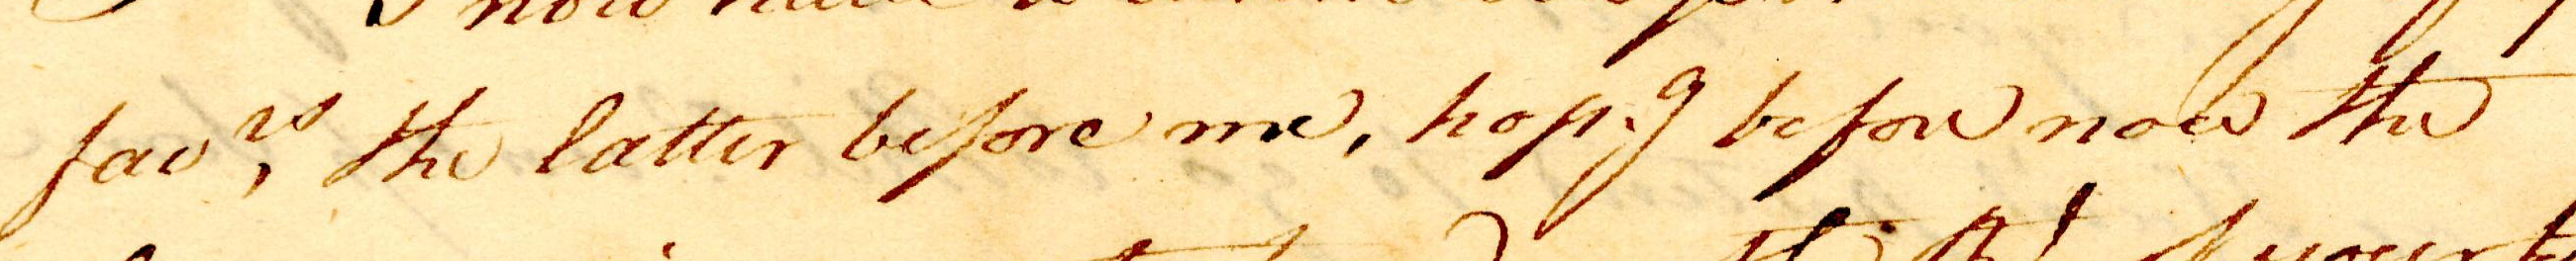fav^rs the latter before me, hop^g before now the
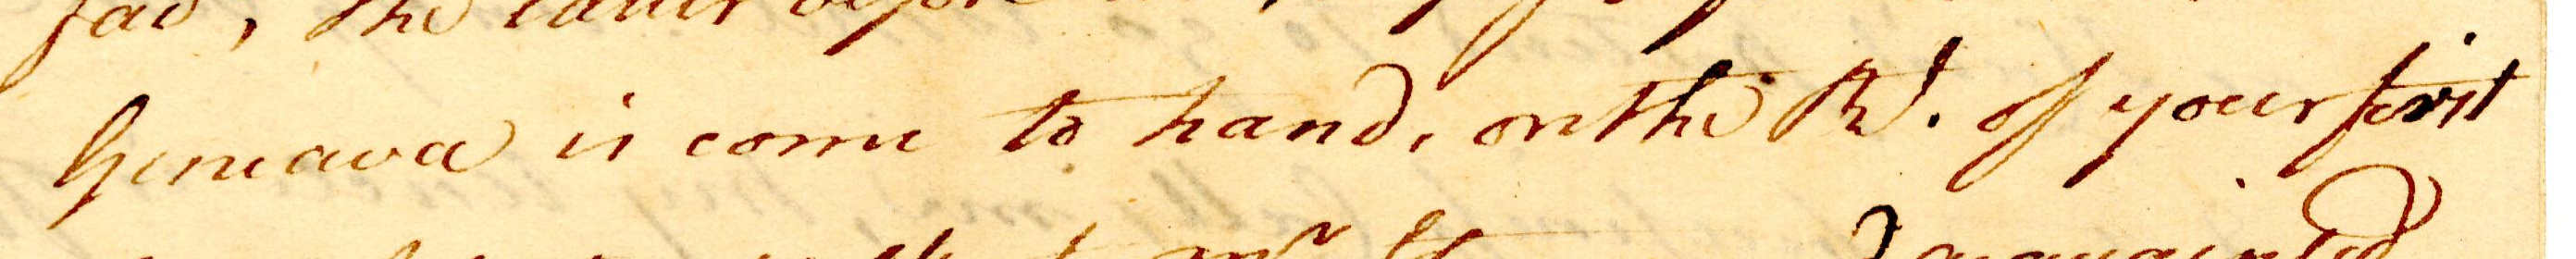Geneava is come to hand, on the R^t. of your first
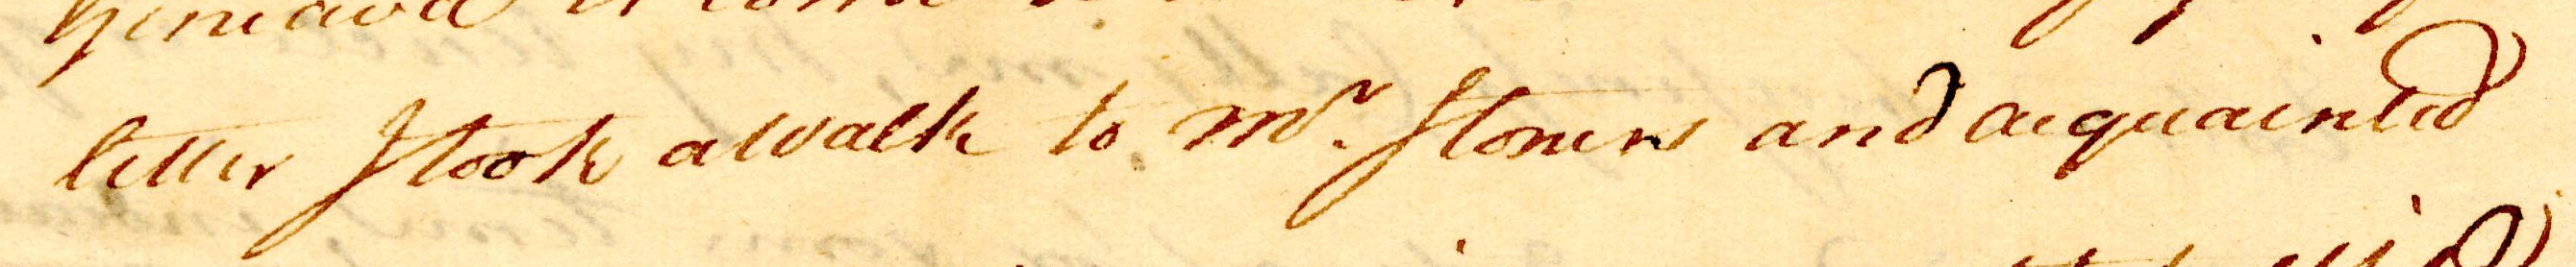letter I took a walk to M^r. Homer and acquainted
